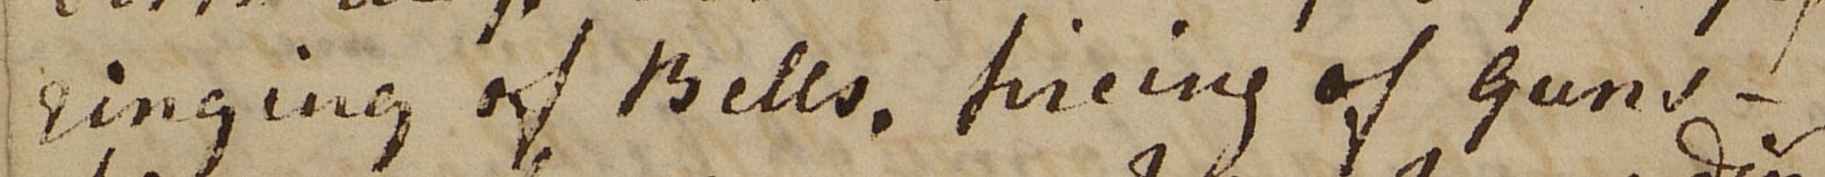ringing off Bells, fireing of Guns-
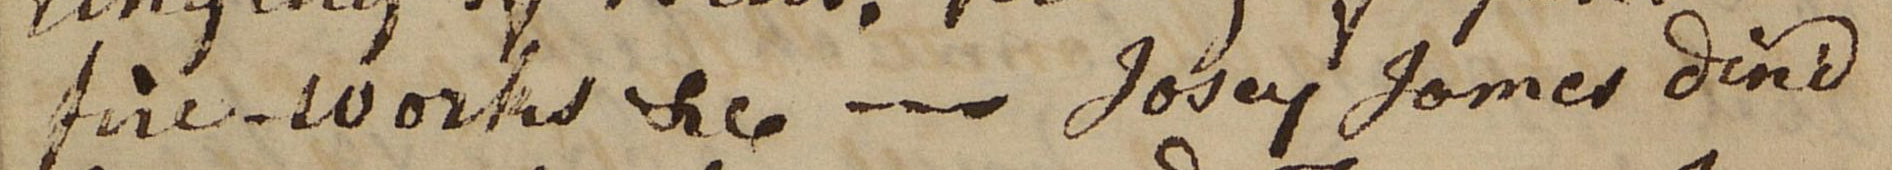fire- works &c- Josey James din'd
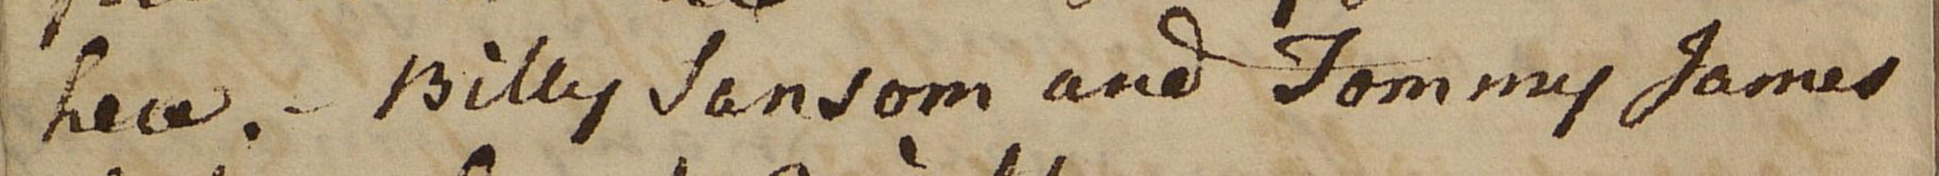here,- Billy Sansom and Tommy James
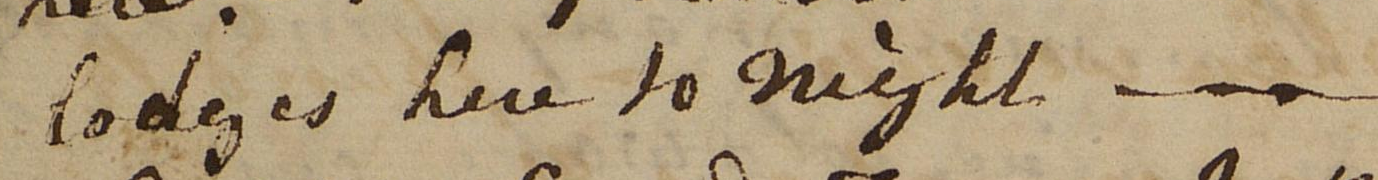lodges here to Night-
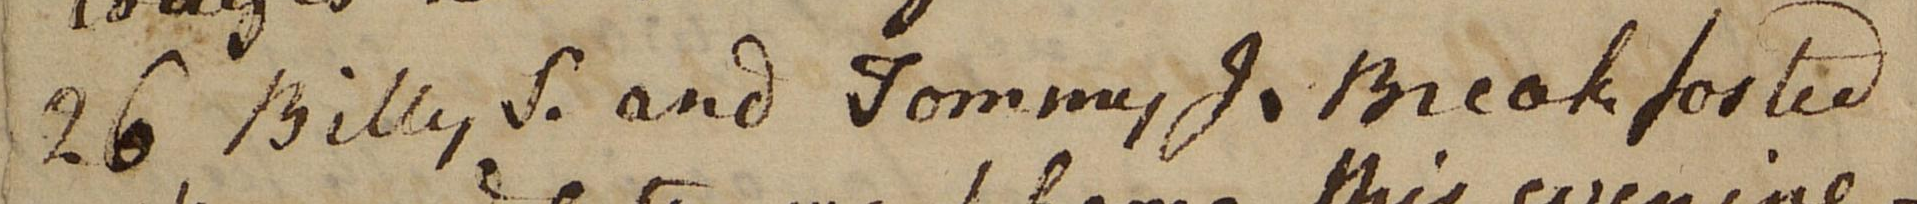26 Billy S. and Tommy J. Breakfasted
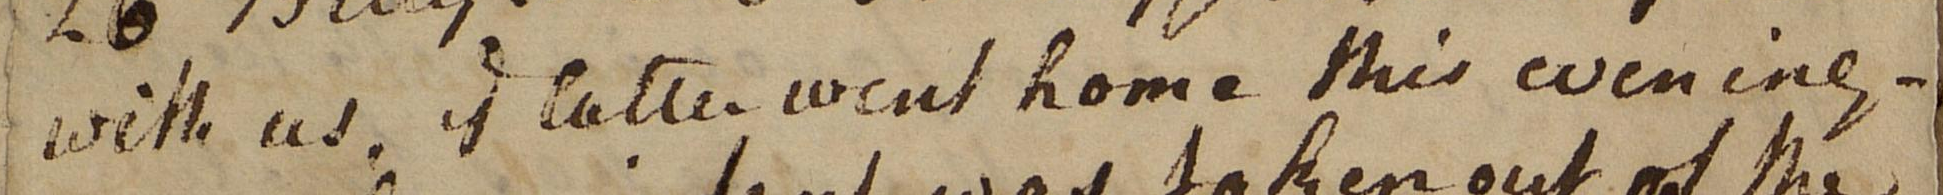with us y^e latter went home this evening-
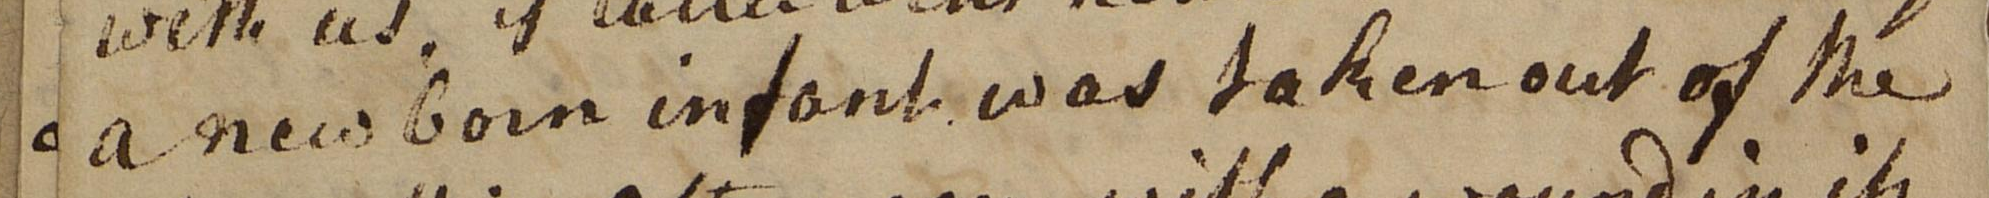a new born infant was taken out of the
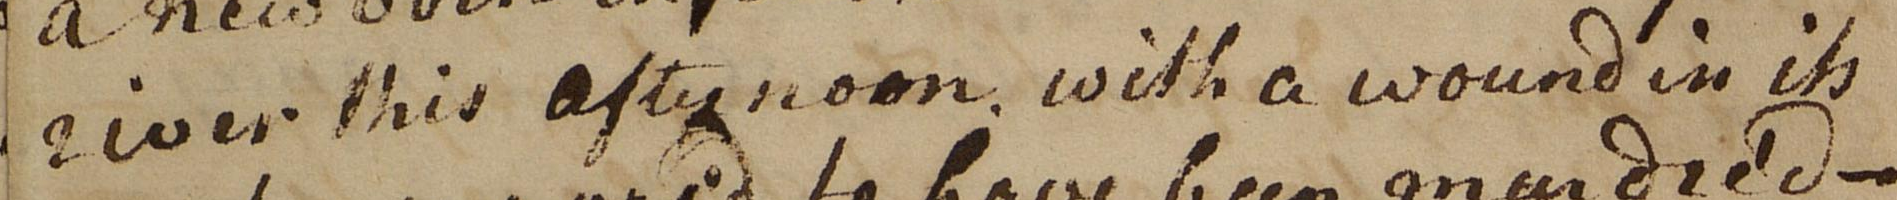River this Afternoon with a wound in its
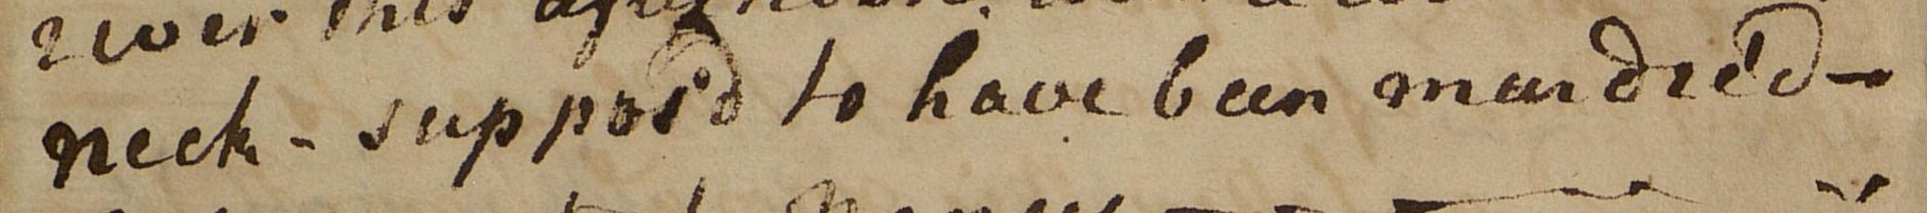neck- suppos'd to have been murdre'd-
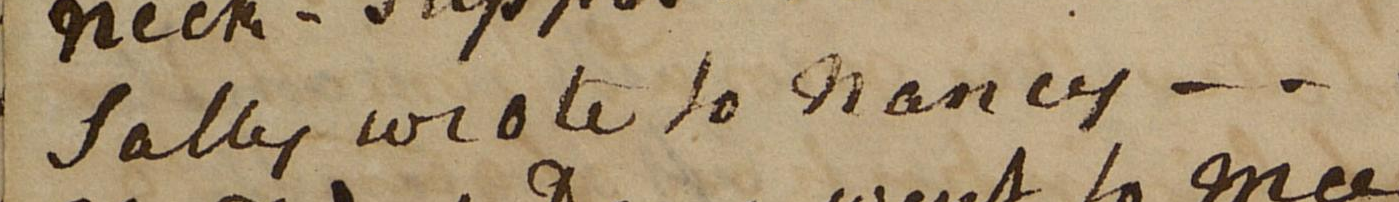Sally wrote to Nancy--
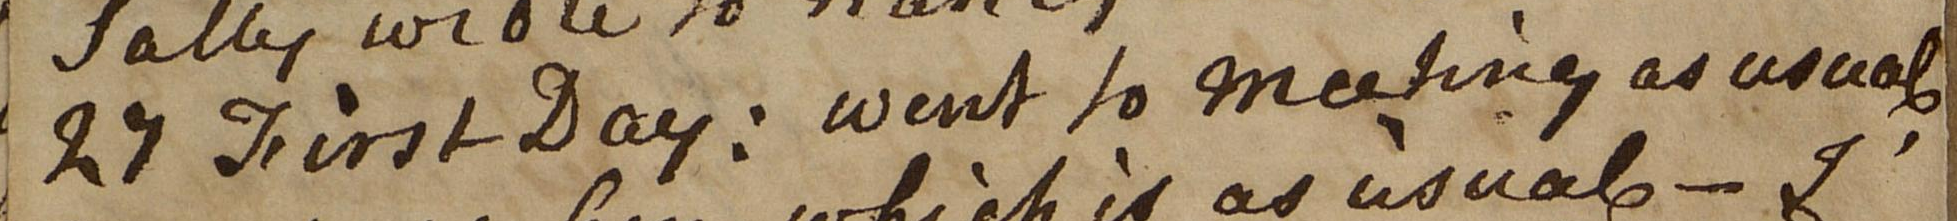27 First Day: went to meeting as usual
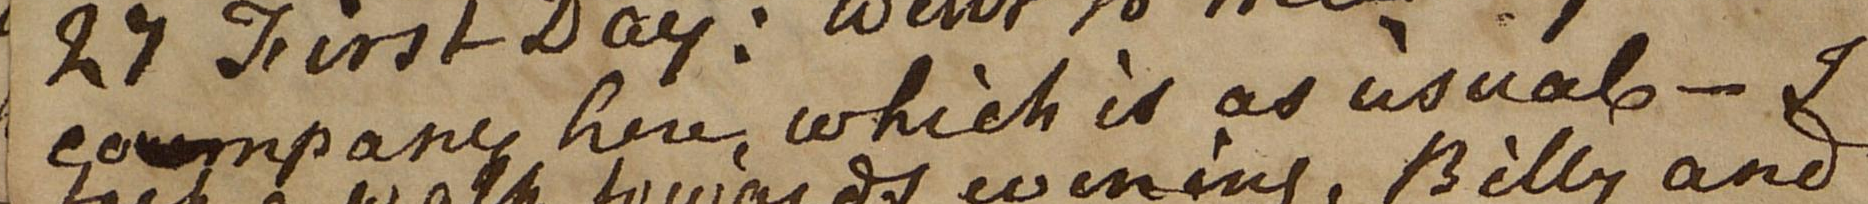company here, which is as usual- I
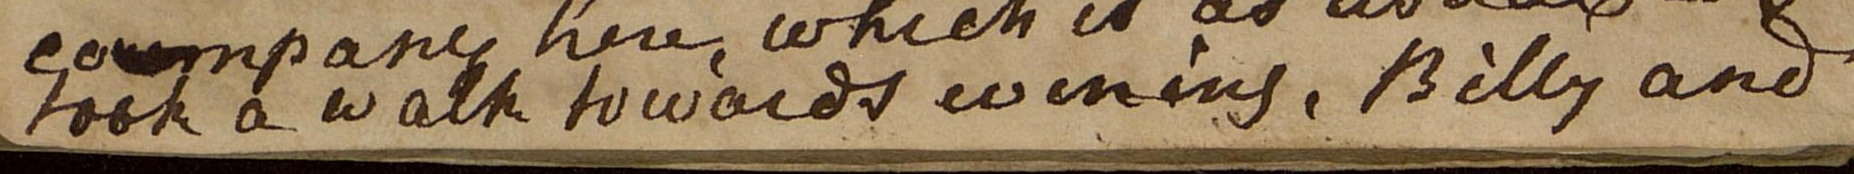took a walk towards evening, Billy and
